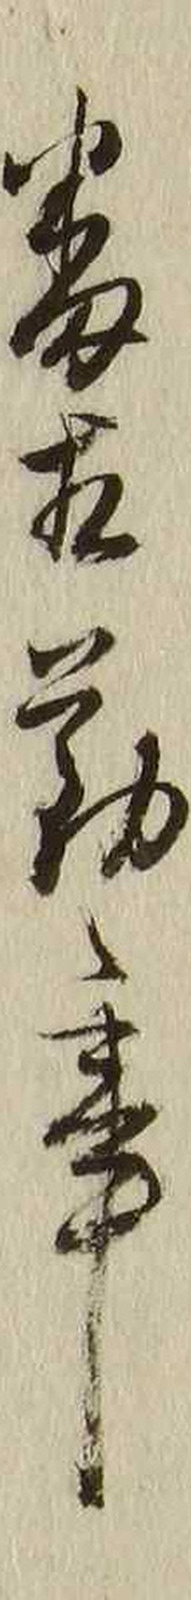番相勤候事
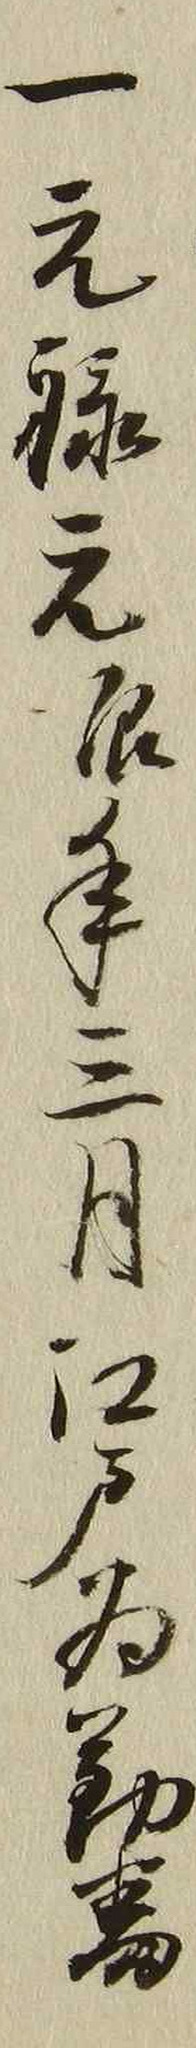一元禄元辰年三月江戸為勤番
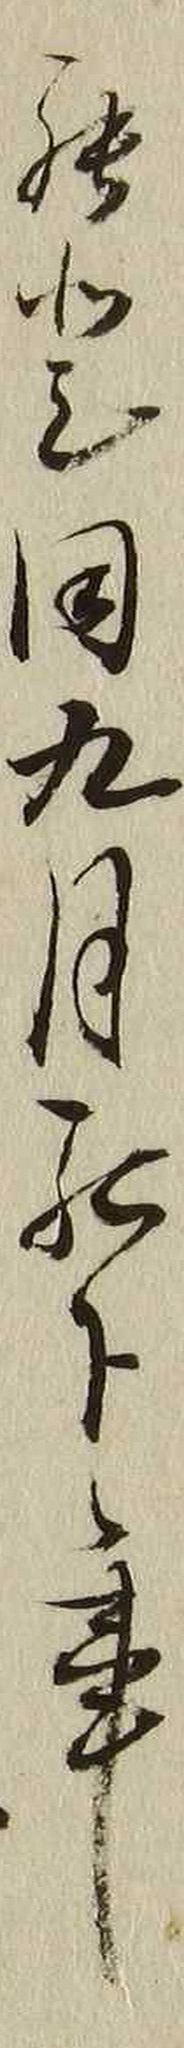罷登同九月罷下候事
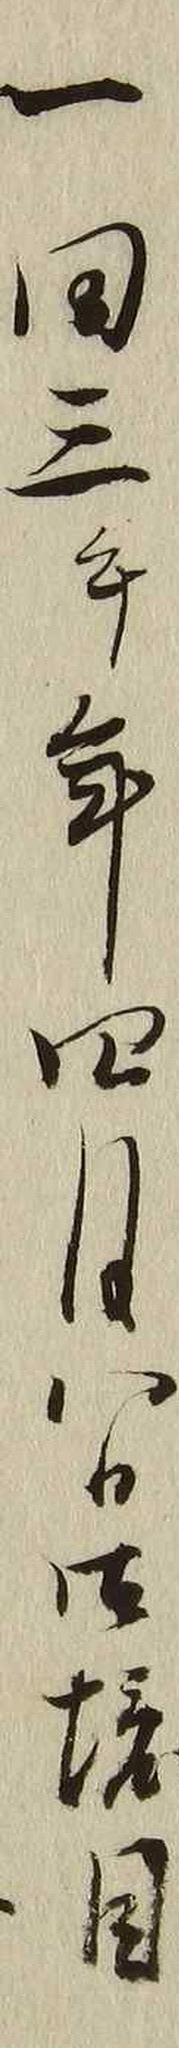一同三午年四月八日御境目
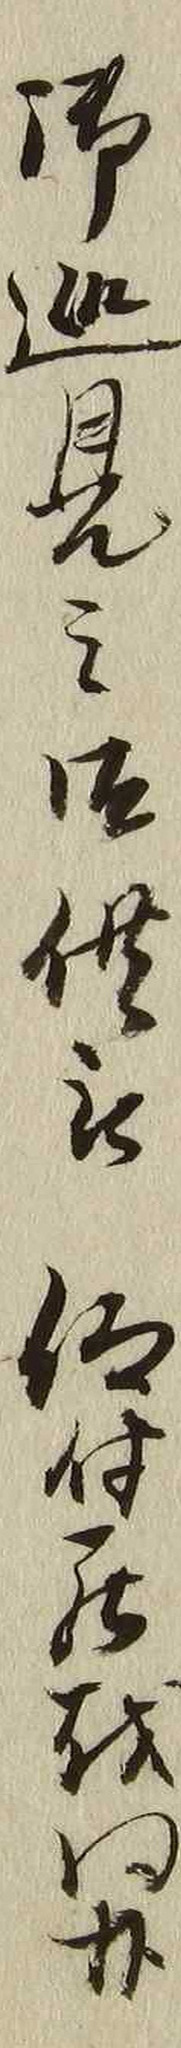御巡見之御供被仰付罷越同廿
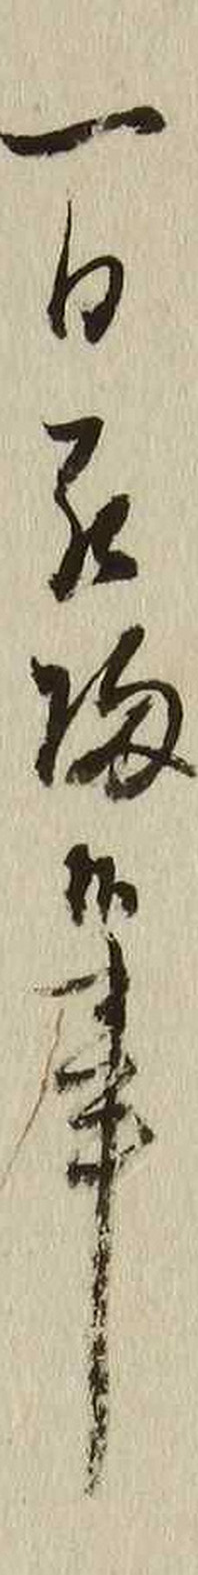一日罷帰候事
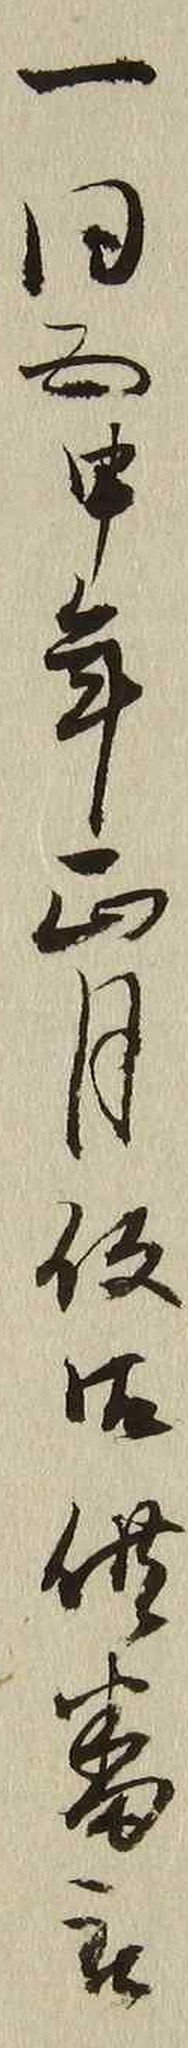一同五申年正月仮御供番被
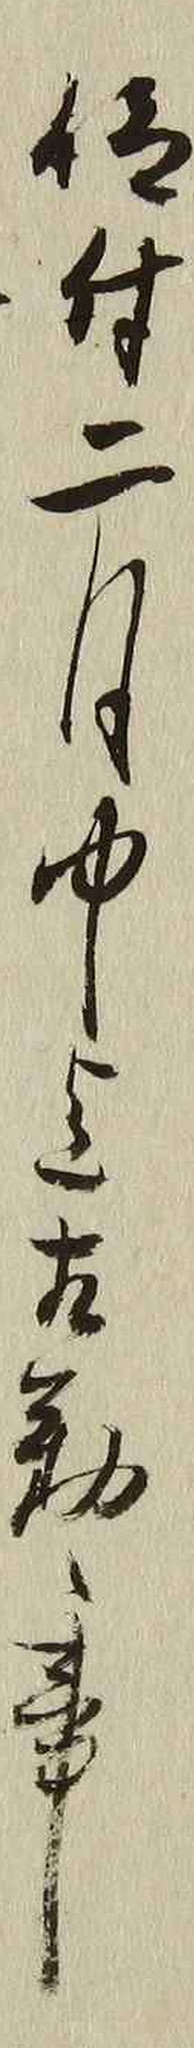仰付二月中迄相勤候事
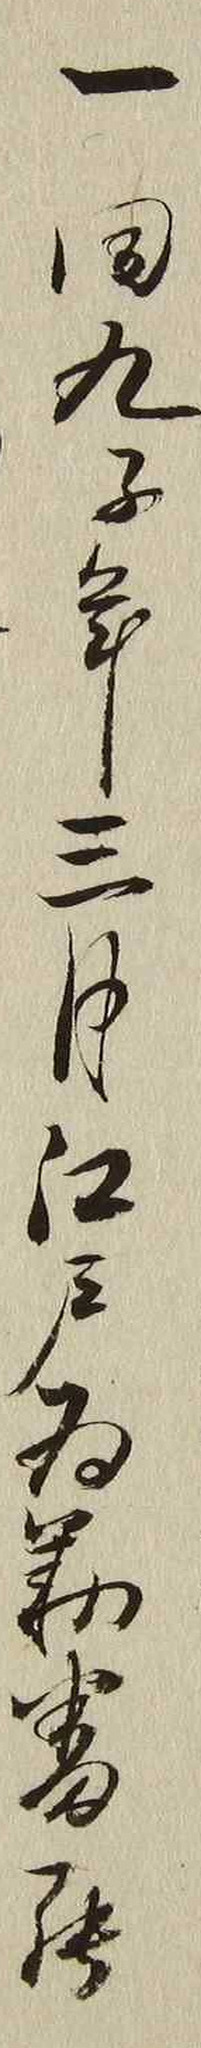一同九子年三月江戸為勤番罷
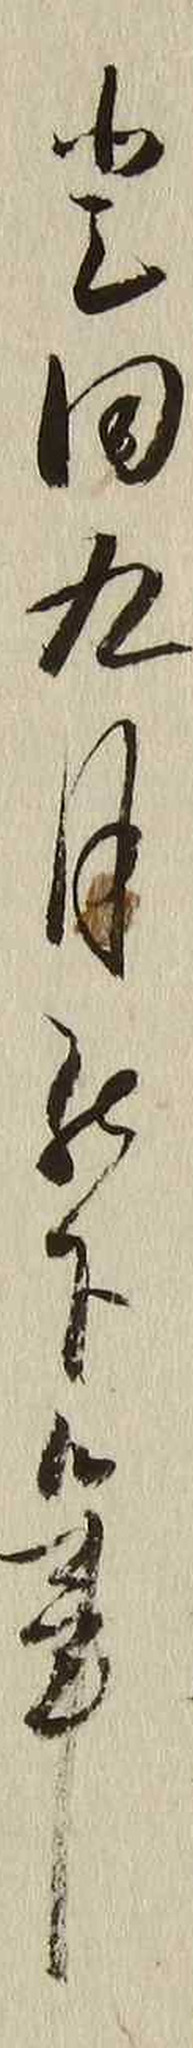登同九月罷下候事
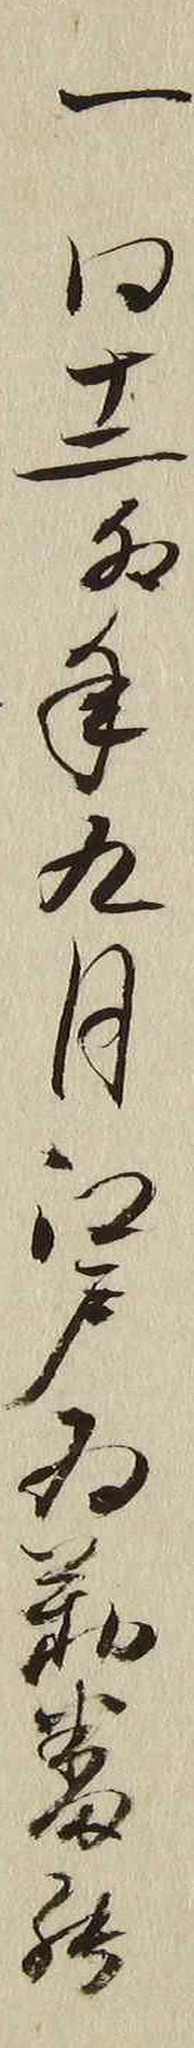一同十二卯年九月江戸為勤番罷
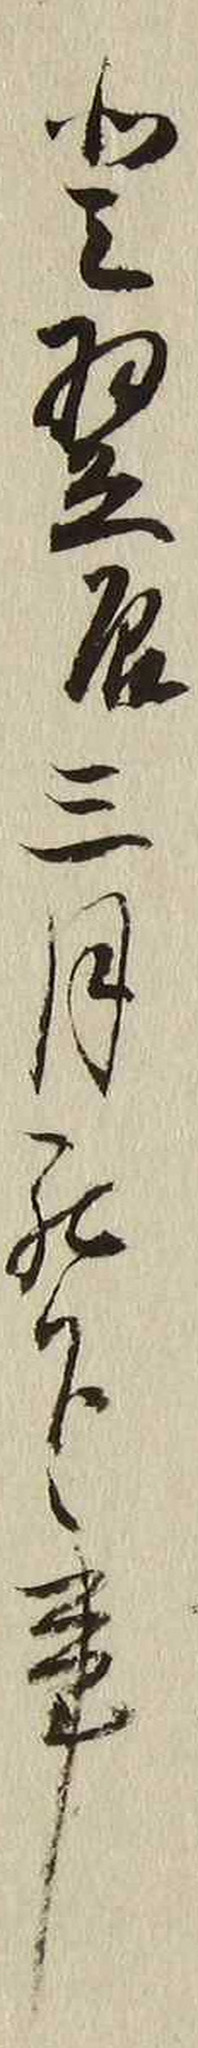登翌辰三月罷下候事
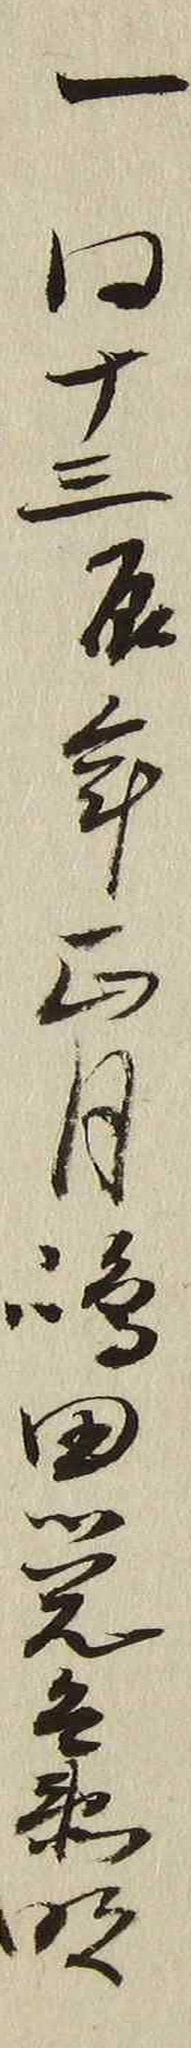一同十三辰年正月島田覚兵衛明
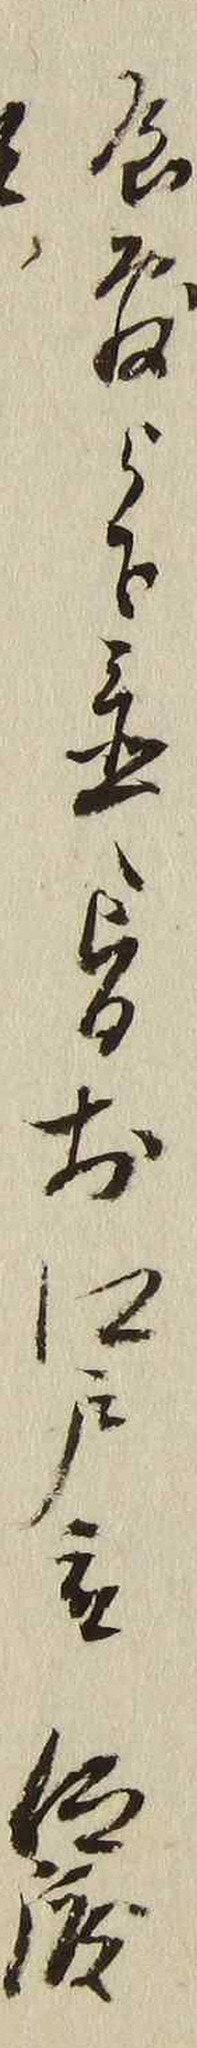屋敷被下置候旨於江戸被仰渡
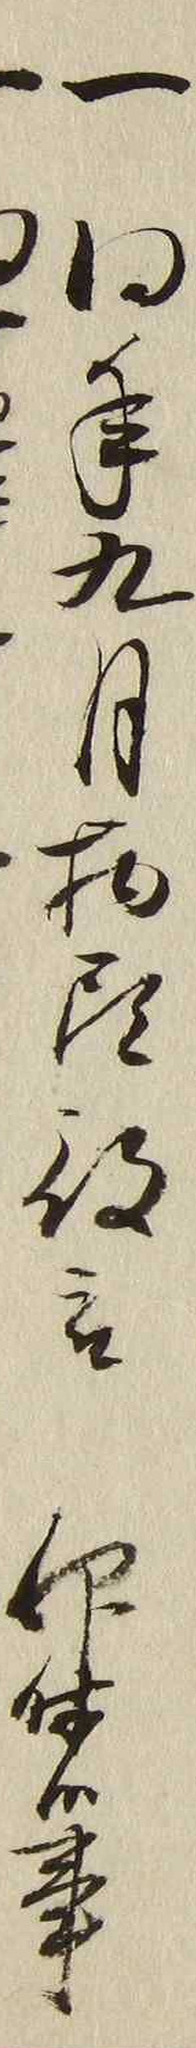一同年巳九月物頭役被仰付候事
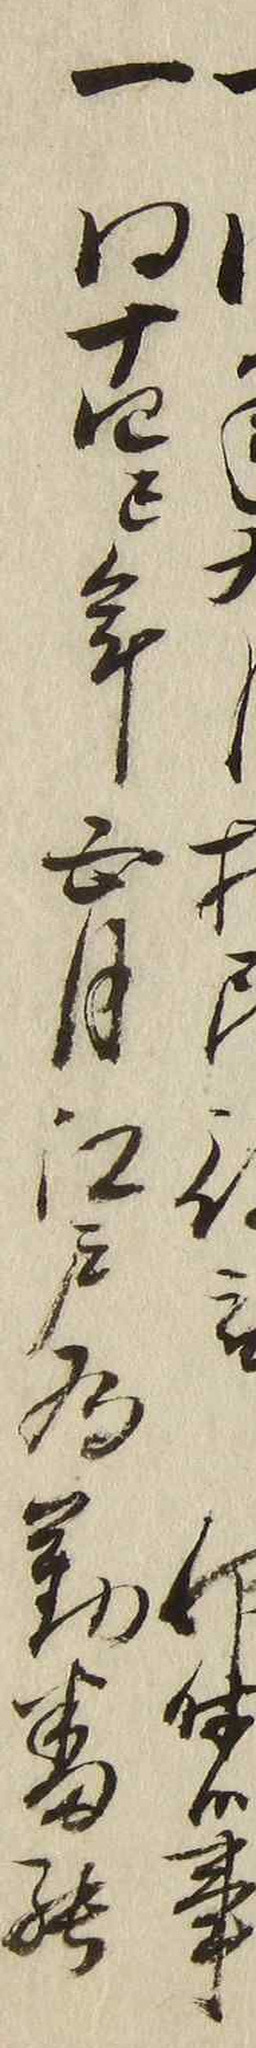一同十四巳年五月江戸為勤番罷
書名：諸士系譜　巻之348　も之部4
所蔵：会津若松市立会津図書館
